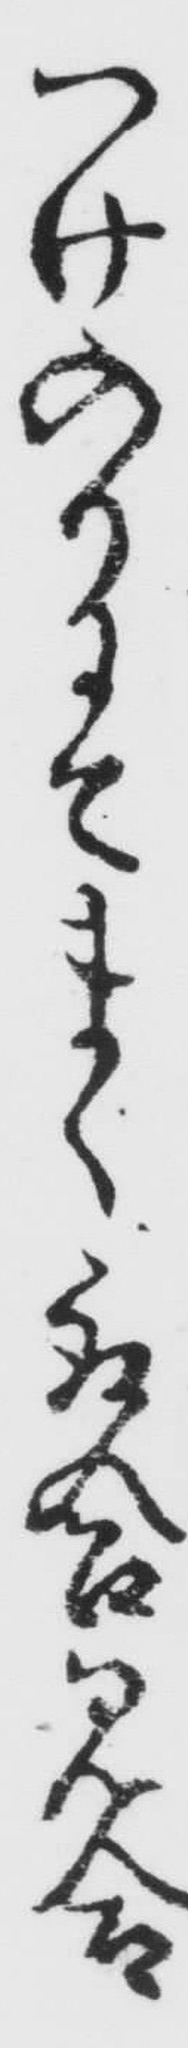つけのりにてまく取合見合
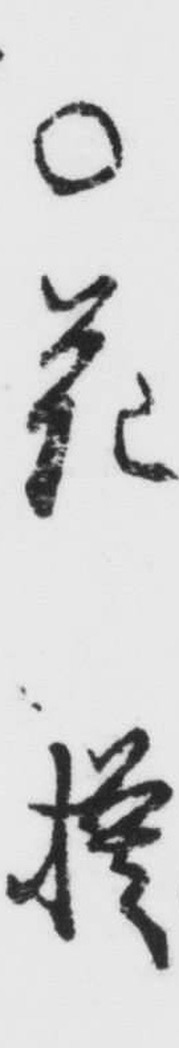○花模
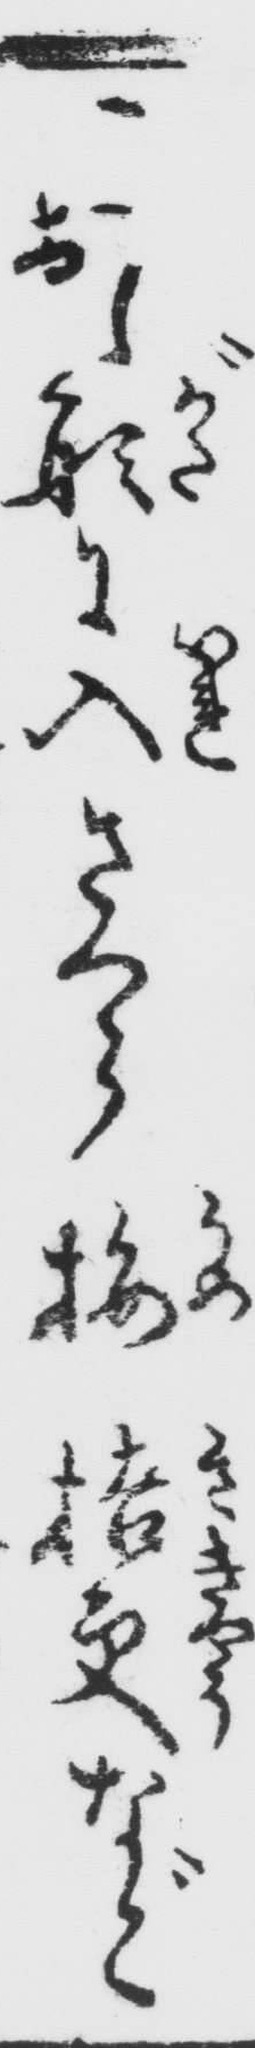一おし形に入さくら梅桔梗など
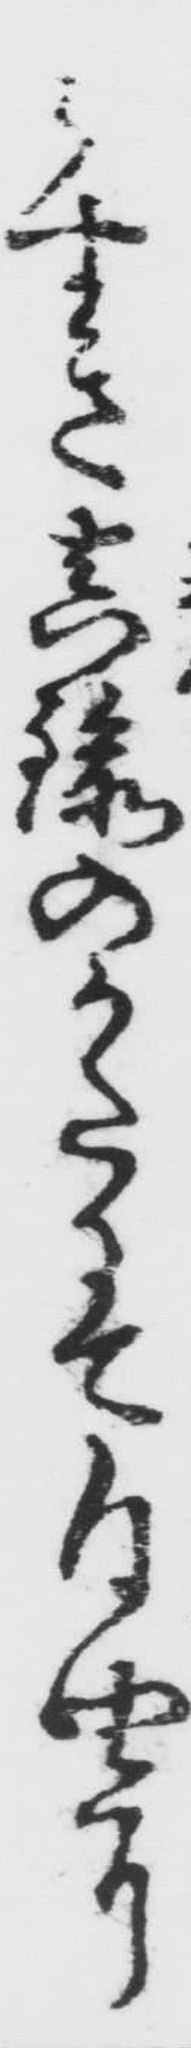うすき真鍮のかたにて自由に
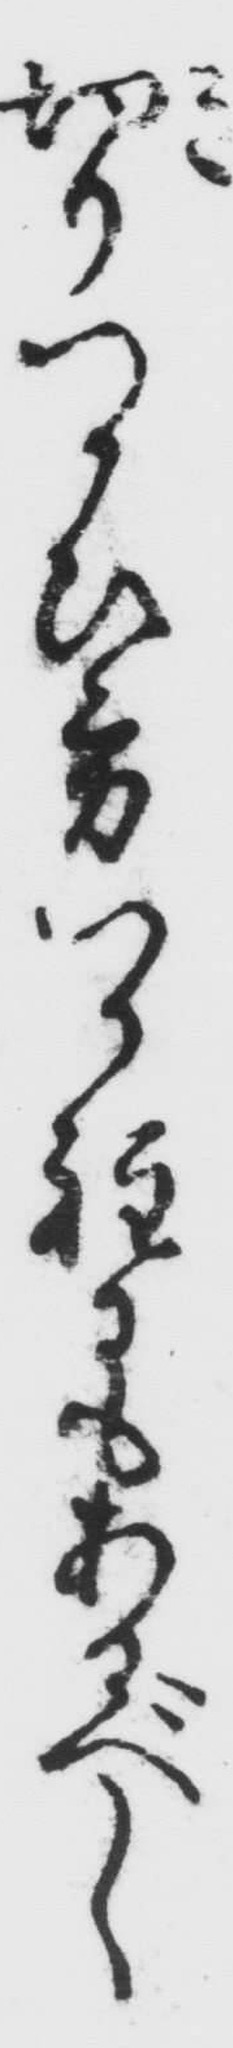切りつかひ方いか程にもあるべし
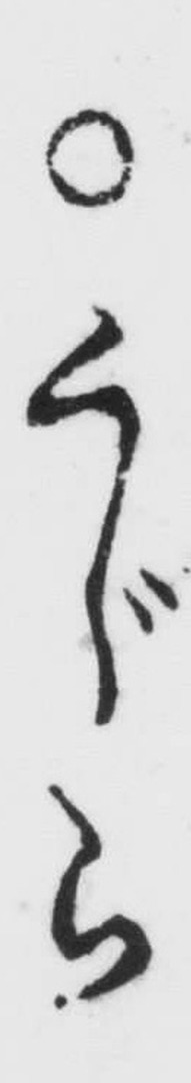○くじら
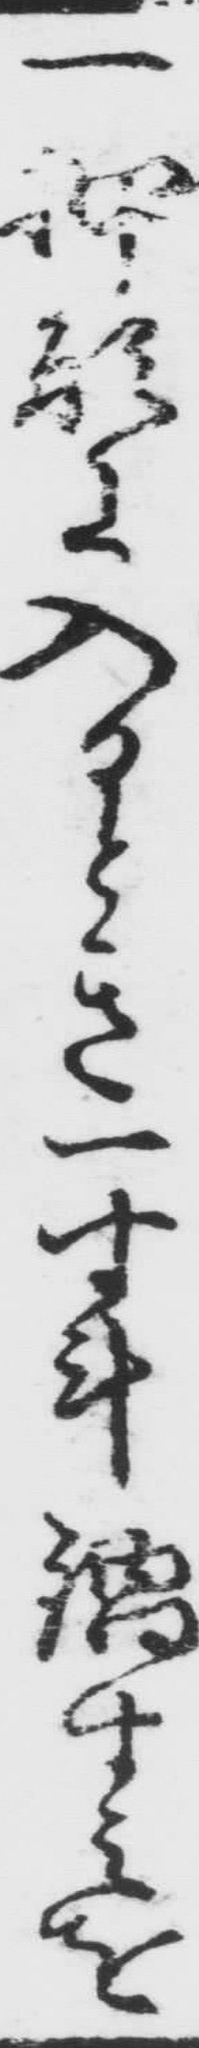一押形に入るとき一寸斗鍋すみを

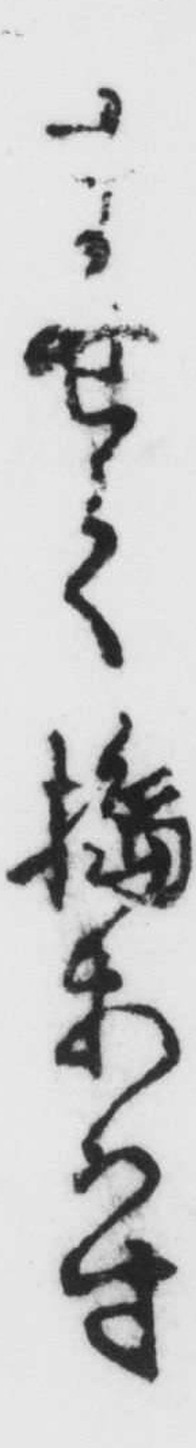ませて搗あはす
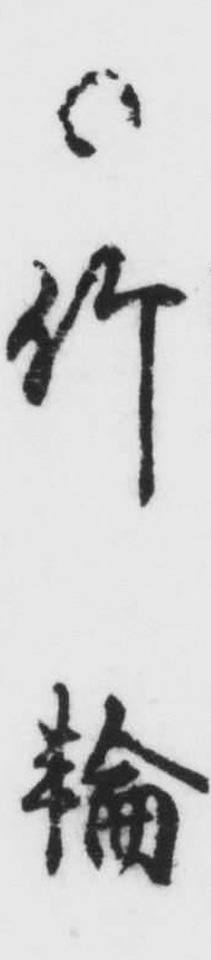○竹輪
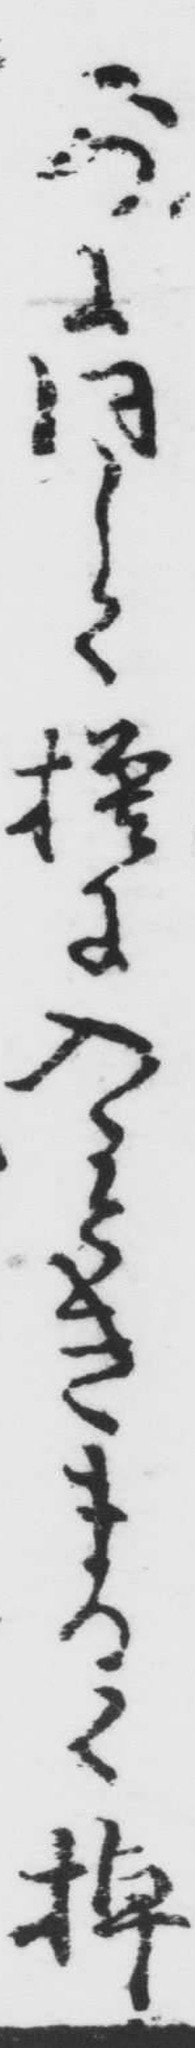一前に同しく模に入るときまるく棹
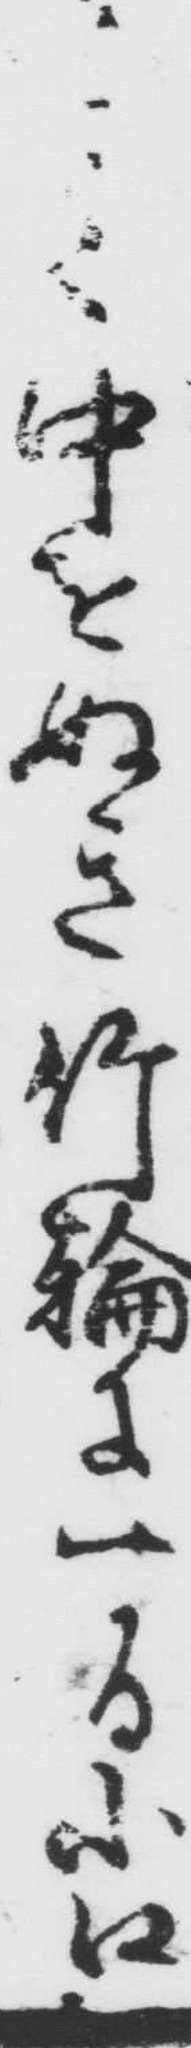く中をぬき竹輪にする小口
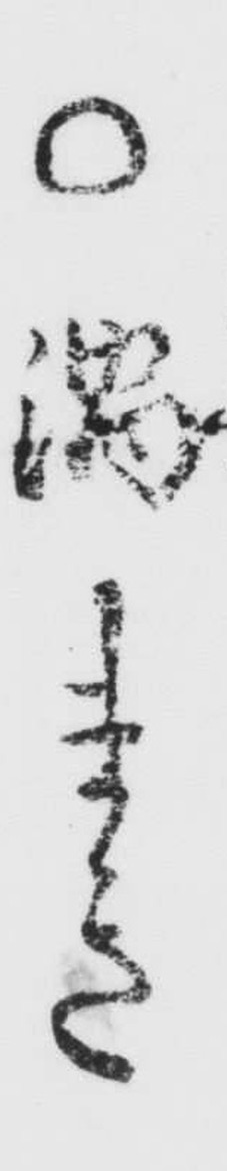○渦まき
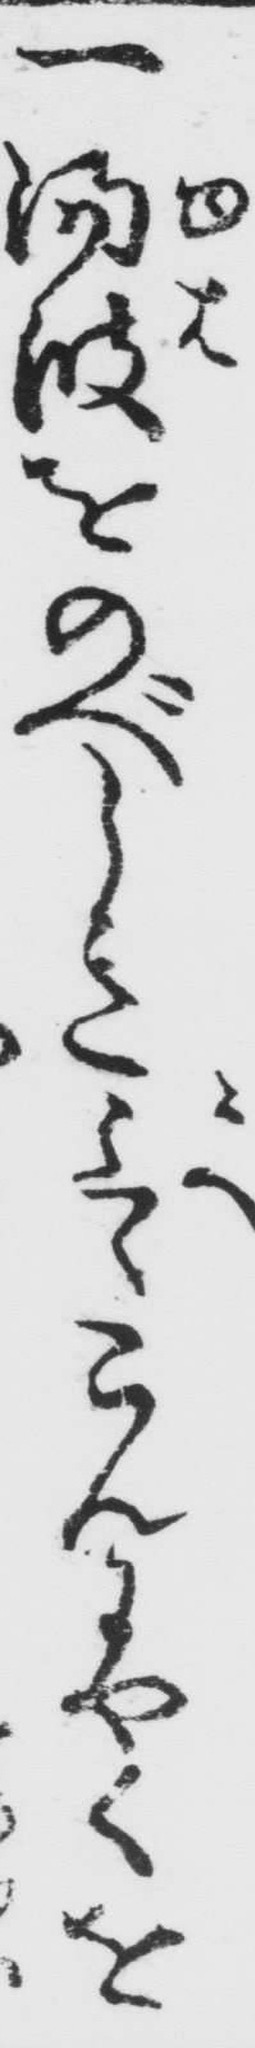一湯波をのべしき上へこんにやくを
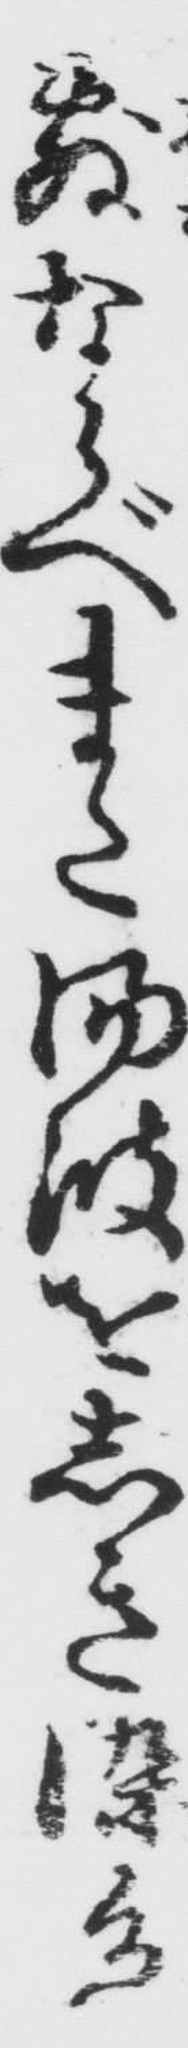敷ならべまた湯波をしき染色
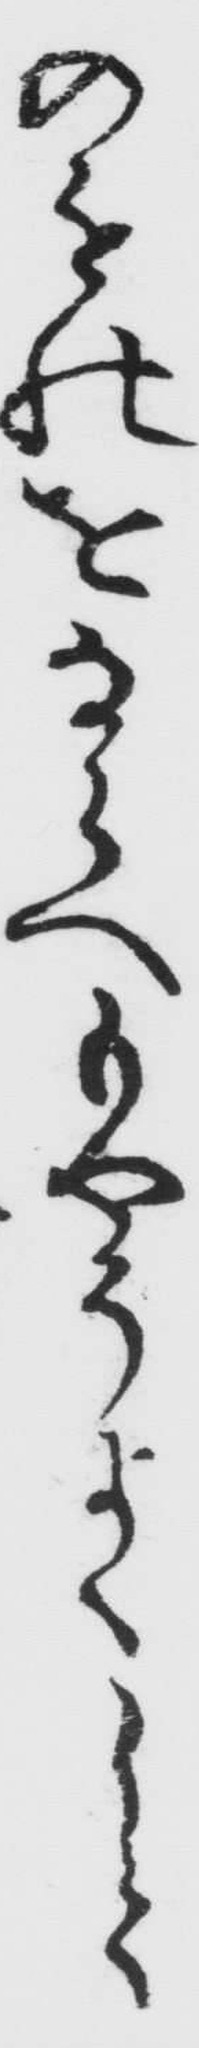のものをならへもやうよくして
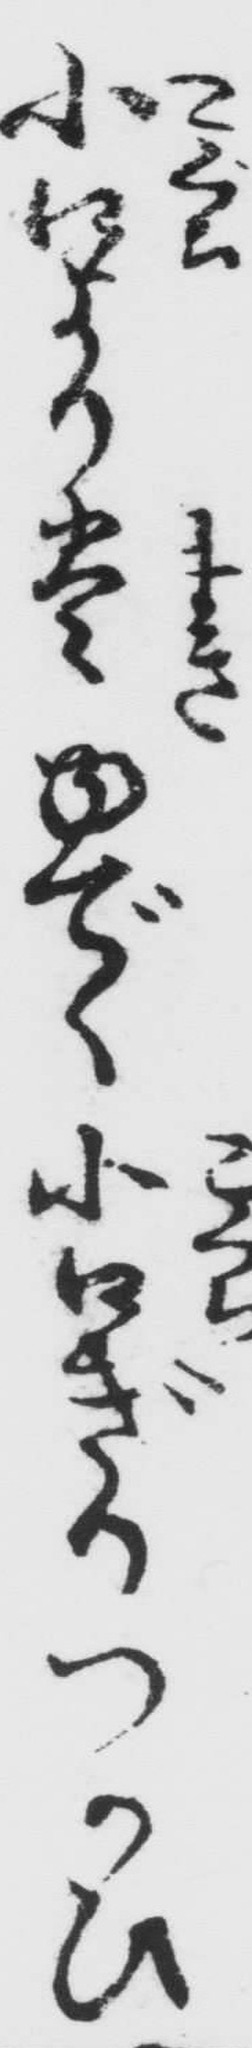小口より巻ゆでゝ小口ぎりつかひ
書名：蒟蒻百珍
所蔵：大阪府立大学学術情報センター 国文学研究資料館
